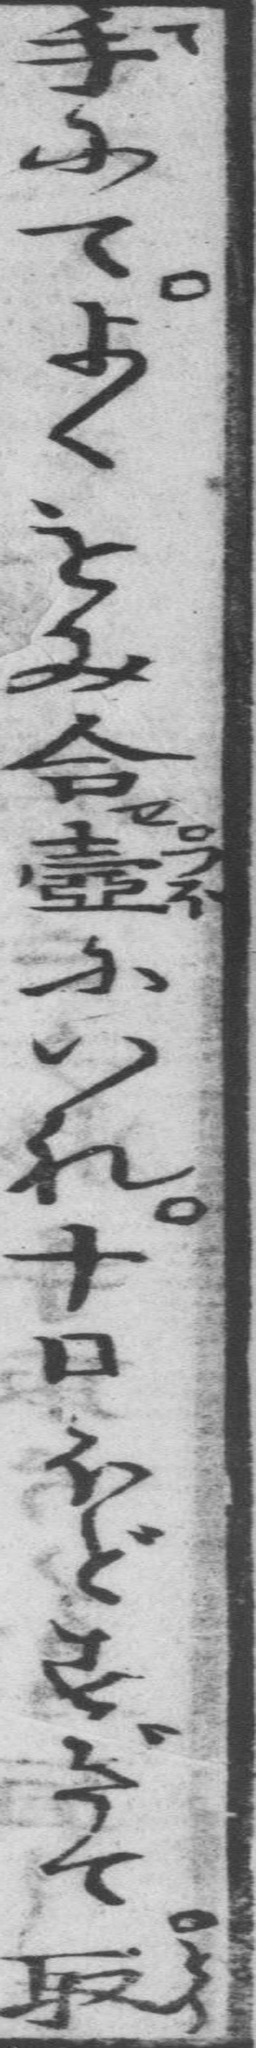手にて。よくもみ合せ。壺にいれ。十日ほどすぎて。取
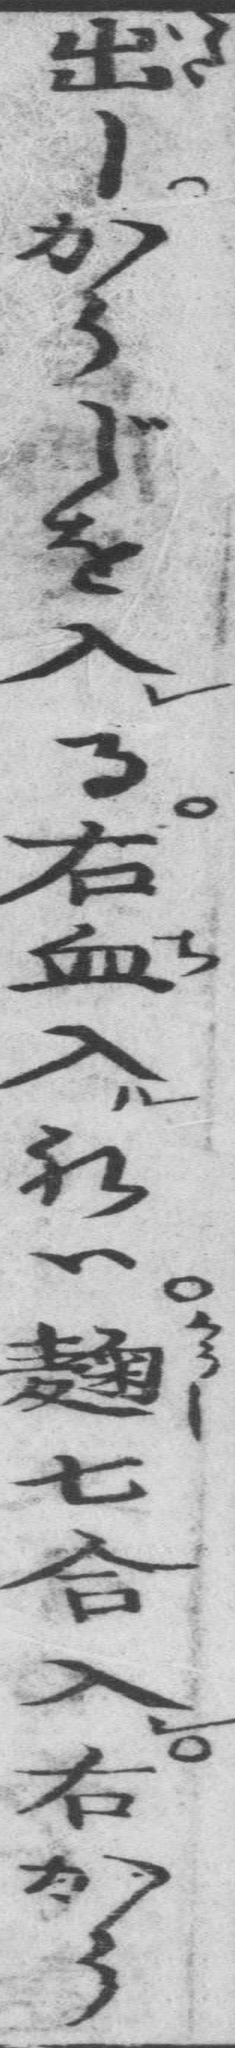出し。かうじを入れる。右血入るれは。麹七合入れ。右かう
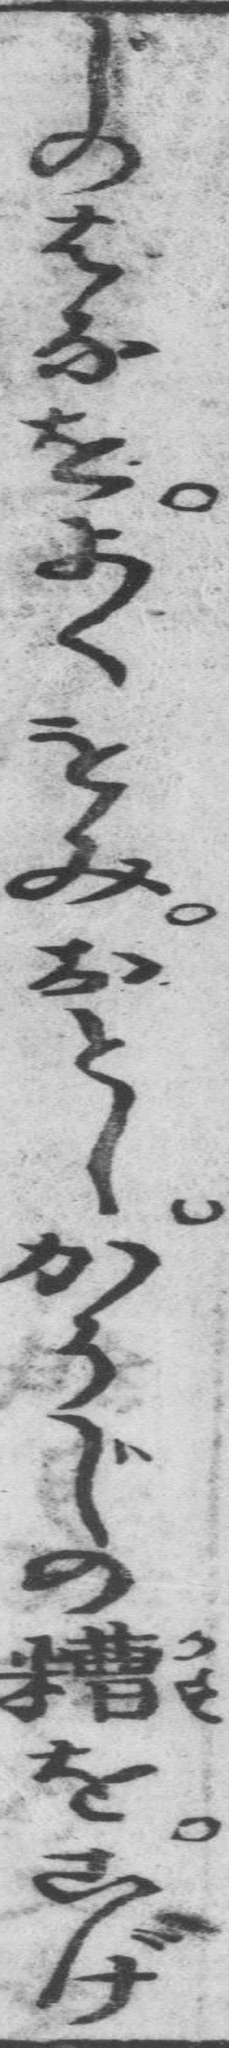じのはなを。よくもみ。おとし。かうじの糟を。こげ
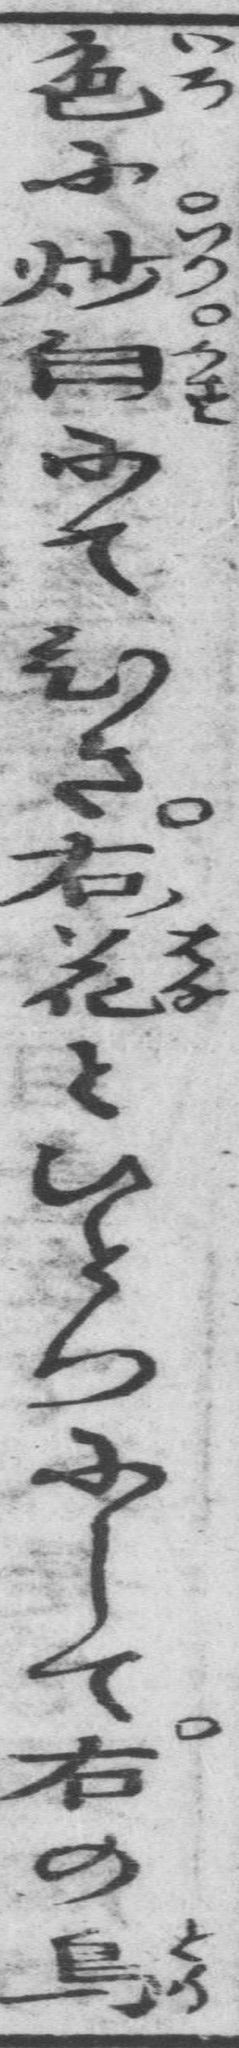色に。炒。臼にてひき。右の花とひとつにして。右の鳥
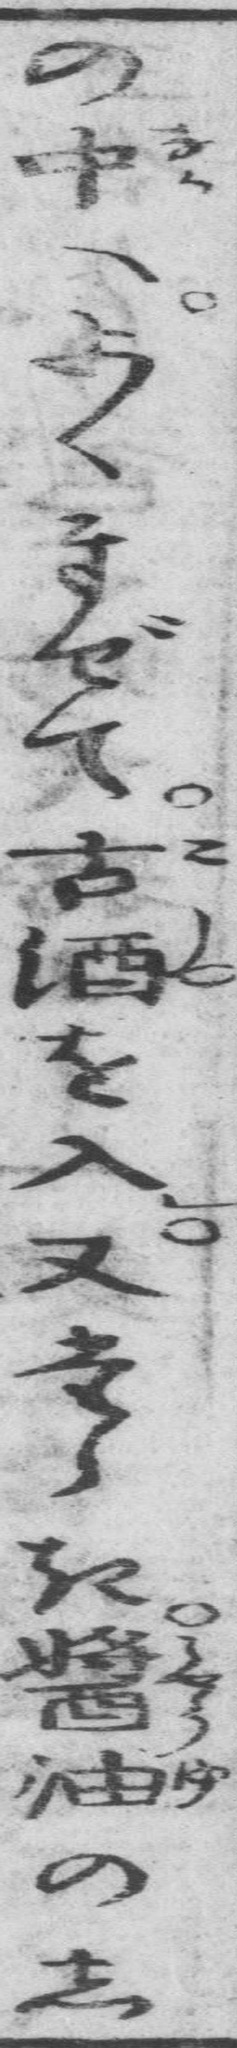の中へ。よくまぜて。古酒を入れ。又たゝき。醤油のし
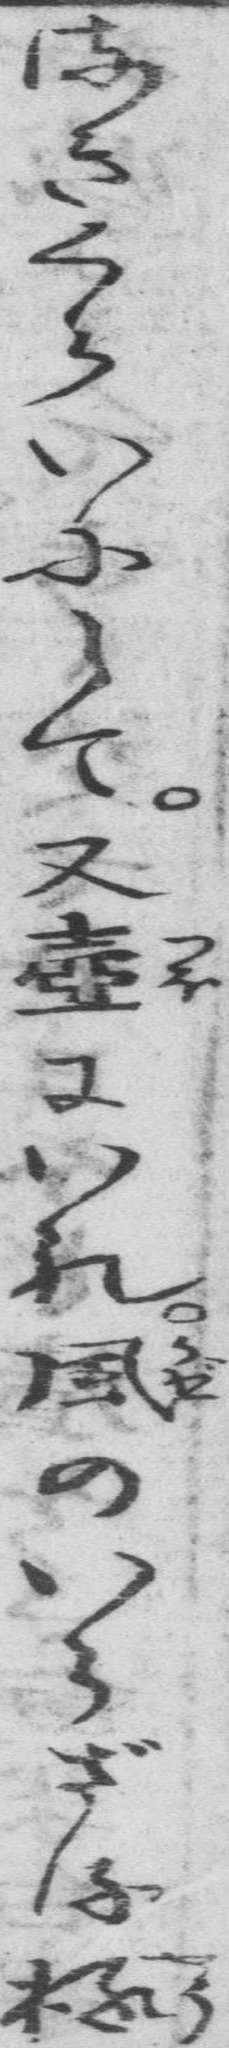るきくらいにして。又壺にいれ。風のいらざる様
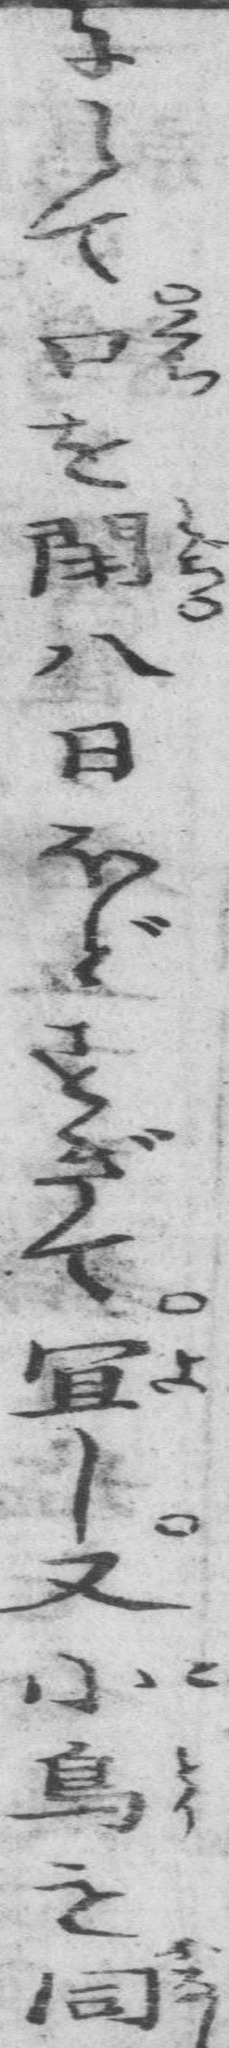にして。口を閉。八日ほどすぎて。宜し。又小鳥も同
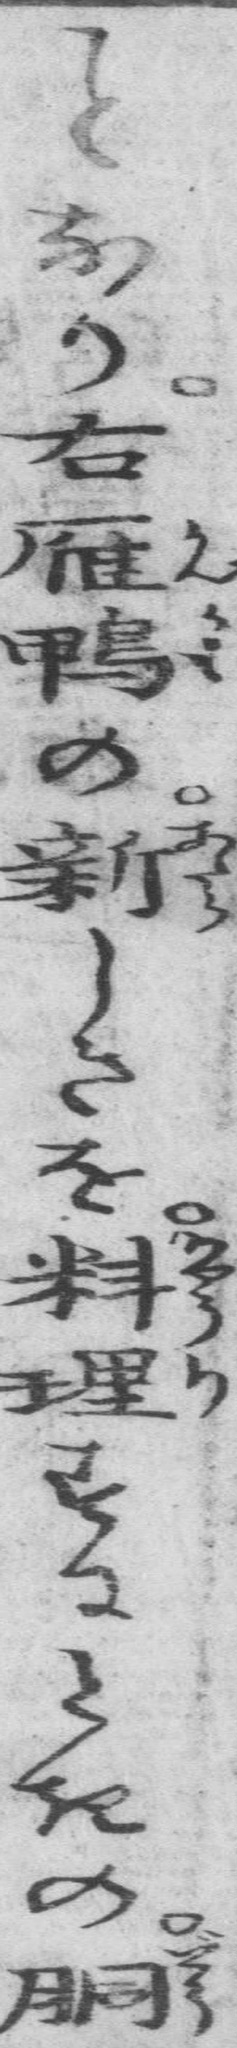ことなり。右雁鴨の。新しきを。料理するときの。胴
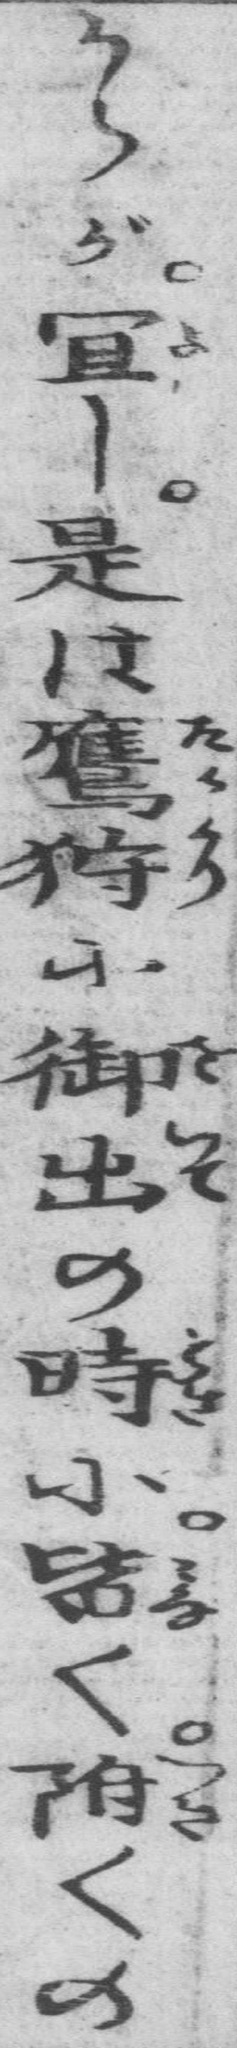からが。宜し。是は鷹狩に御出の時に。皆〳〵。附〳〵の

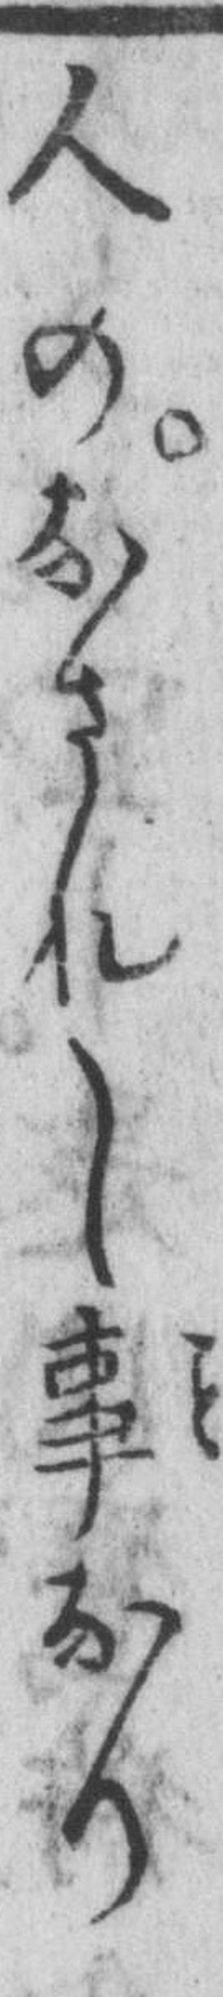人の。なされし事なり
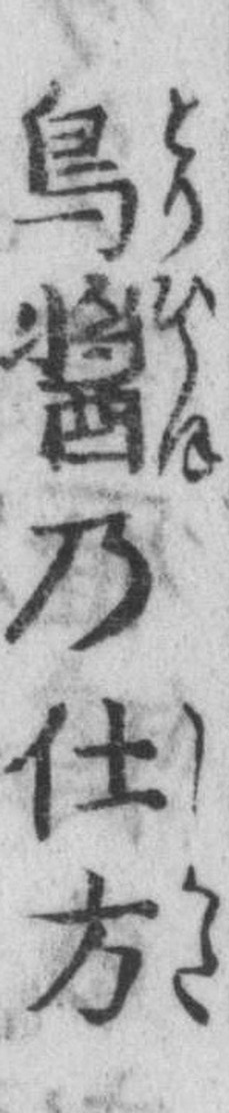鳥醤の仕方
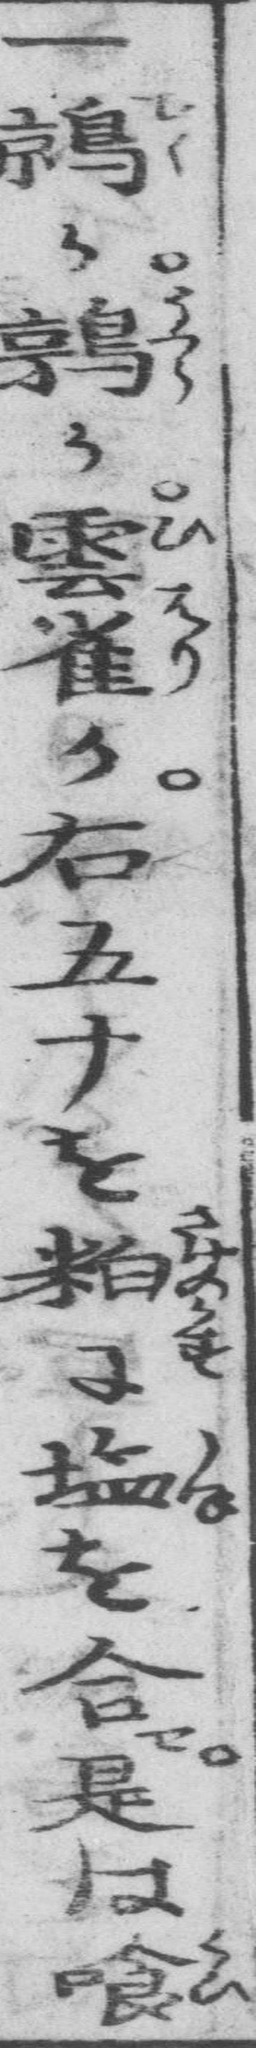一鶁か。鶉か。雲雀か。右五十を粕に塩を合せ。是は喰
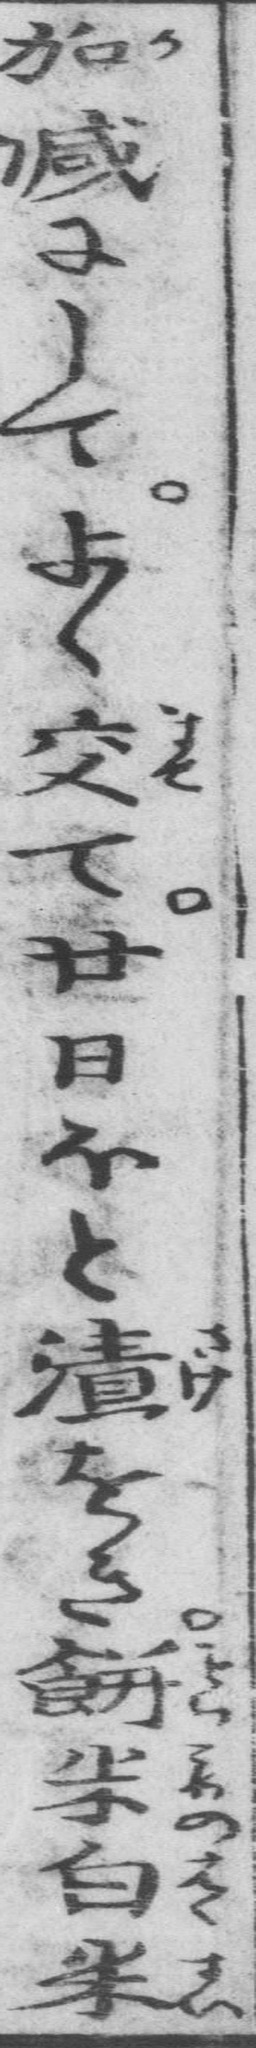加減にして。よく交て。廿日ほと漬をき。餅米白米
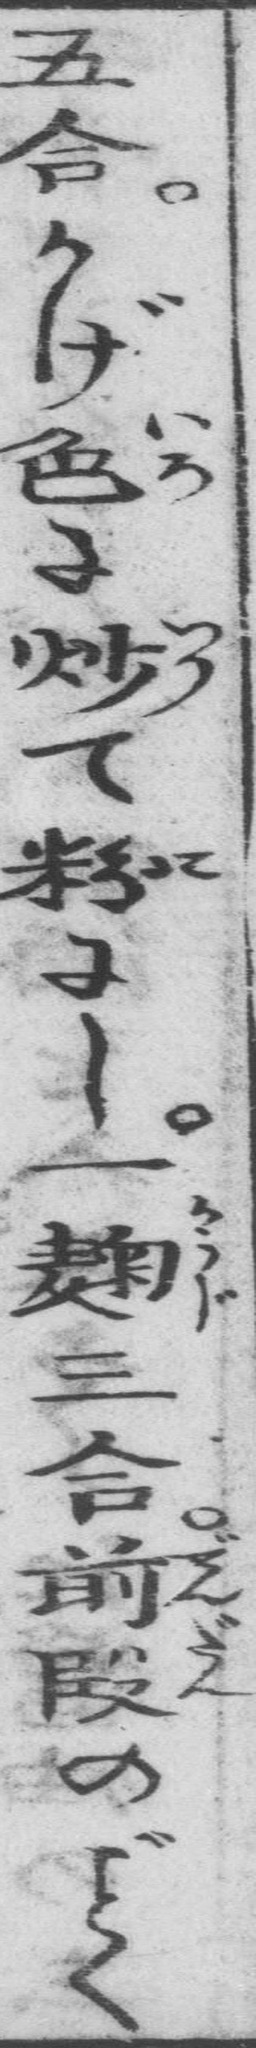五合。かげ色に炒て粉にし。一麹三合。前段のごとく
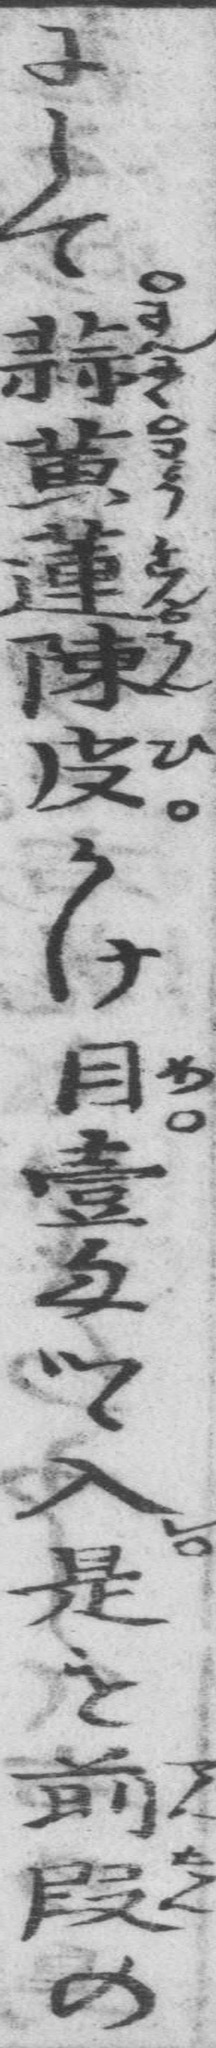にして。蒜。黄蓮。陳皮。かけ目。壱匁つゝ入れ。是も前段の
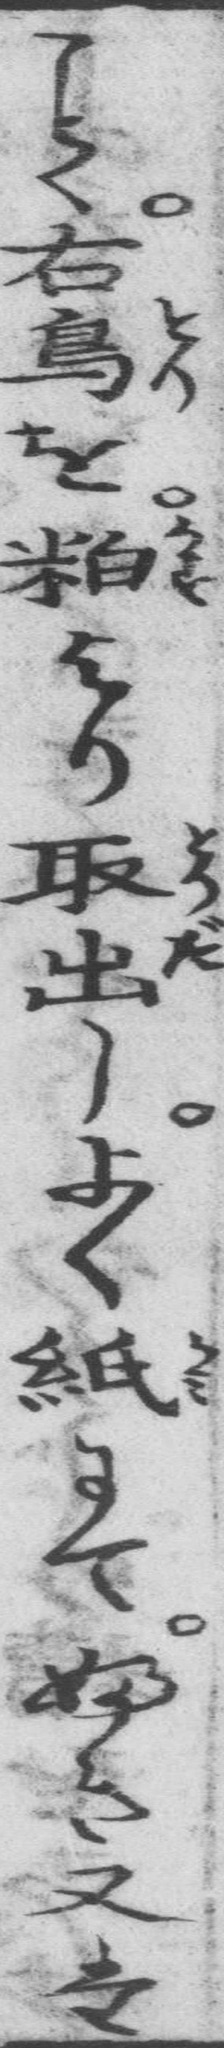ことく。右鳥を。粕より取出し。よく紙にて。ふき又た
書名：萬寳料理秘密箱
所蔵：大阪府立大学学術情報センター 国文学研究資料館
